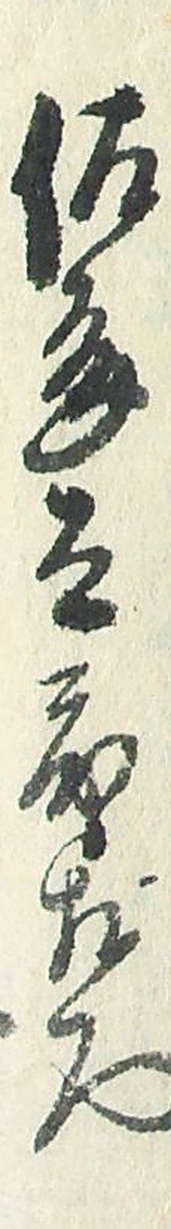佐藤太郎左衛門
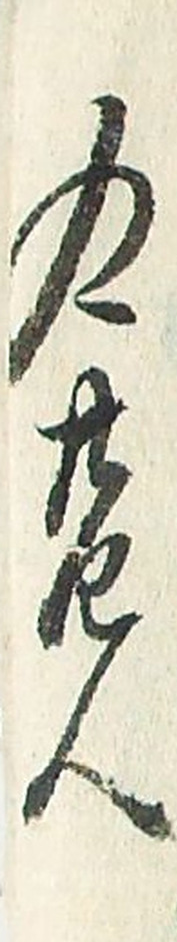右廿四人

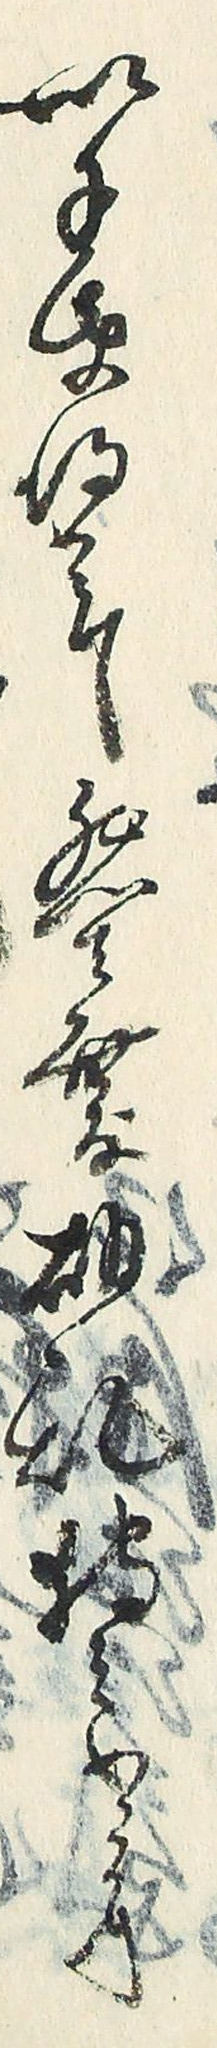以手紙得意候然者此度胡乱狩之義ニ付
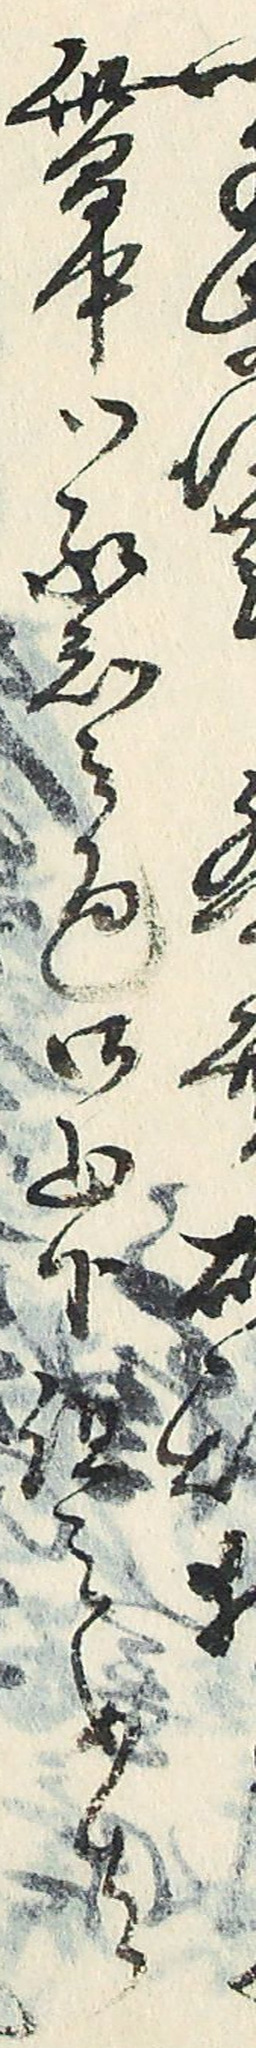此間中御承知之通御山下組々之義者
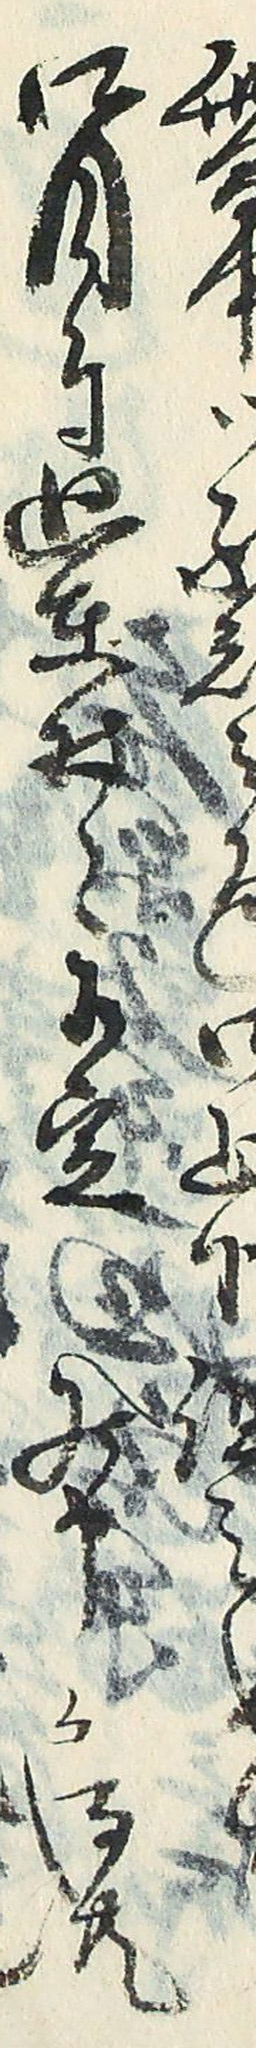郷目付廻在村々相定居申候得共
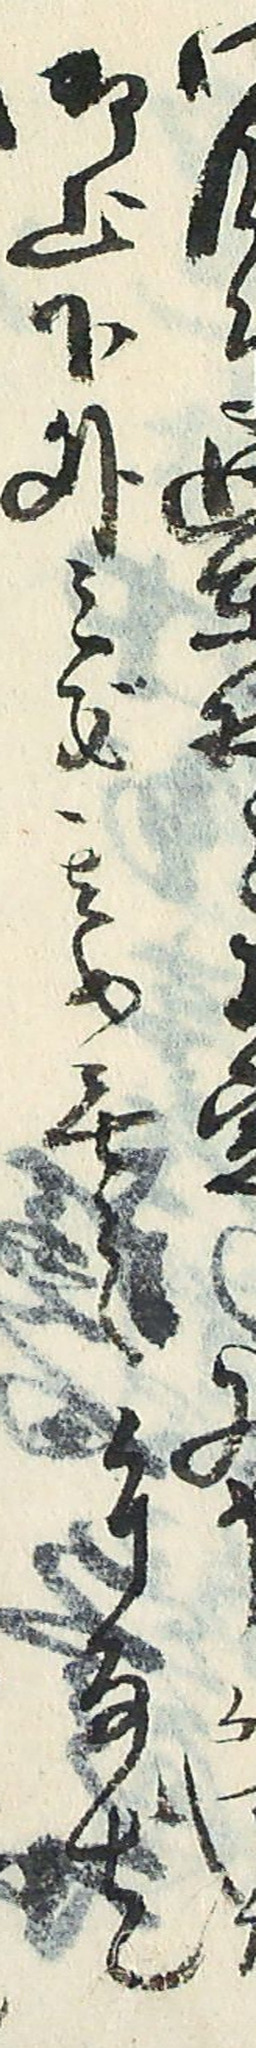御山下外之義其義無之付而者
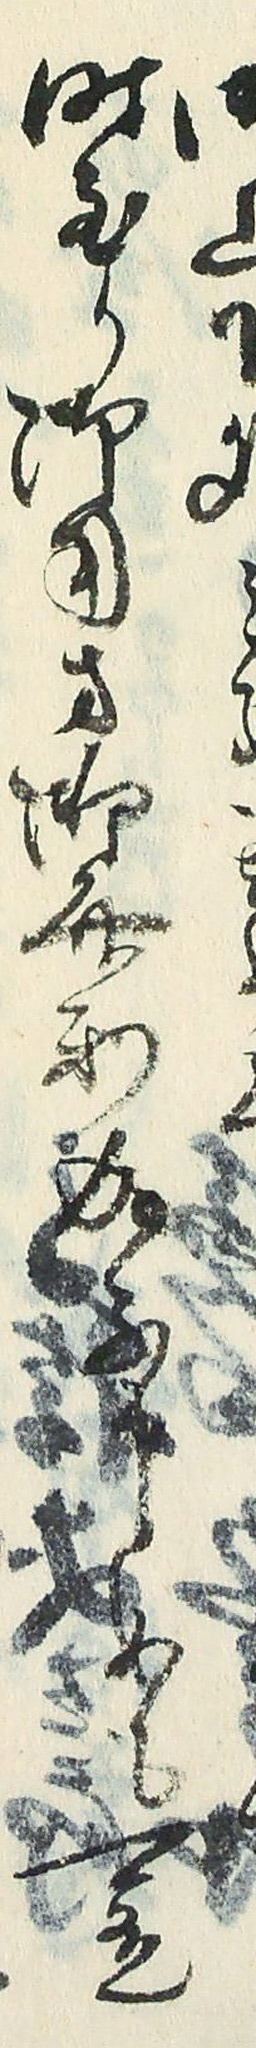時至り御用方御弁利成不申義も可有
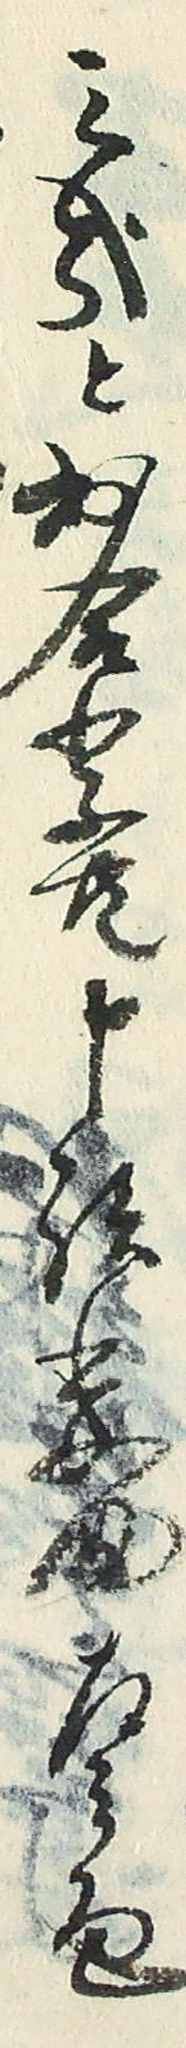之哉と出合小子共申談委細左之通
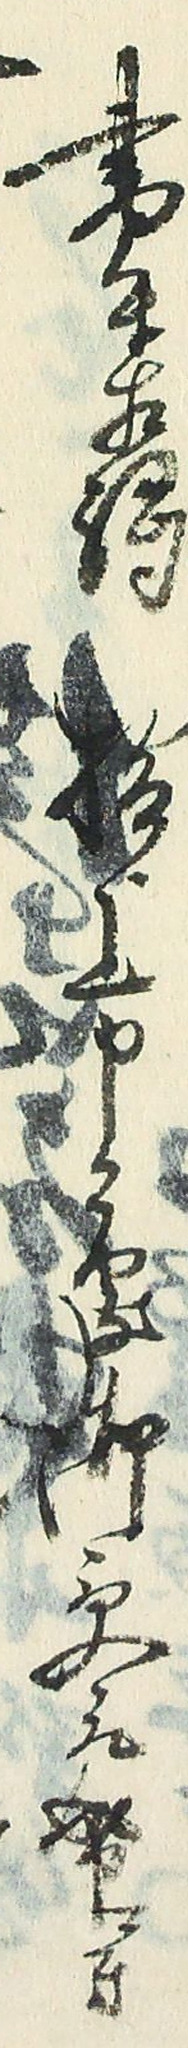書付相認メ指上申候處御受取成候ニ付
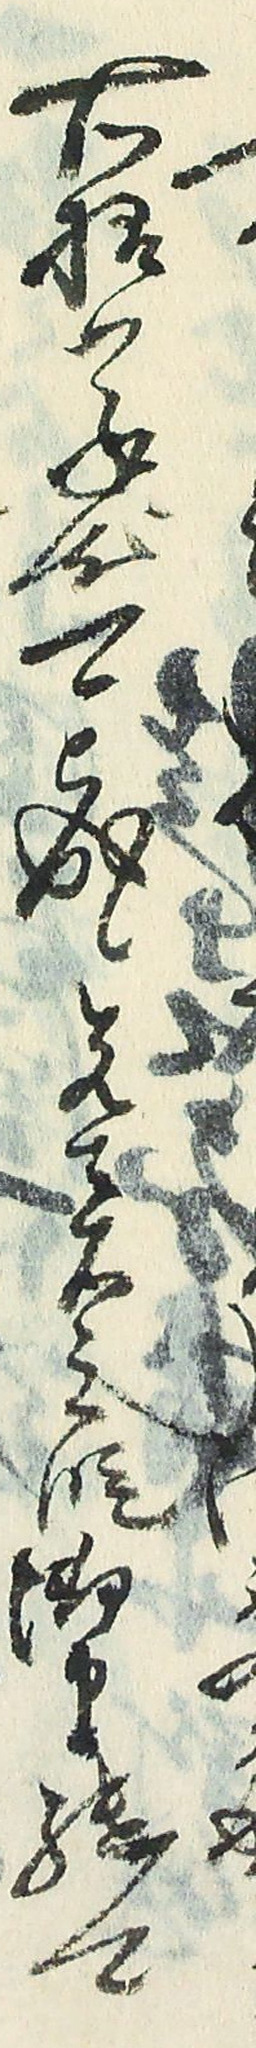右様御承知可被成候先者右之段御申継可
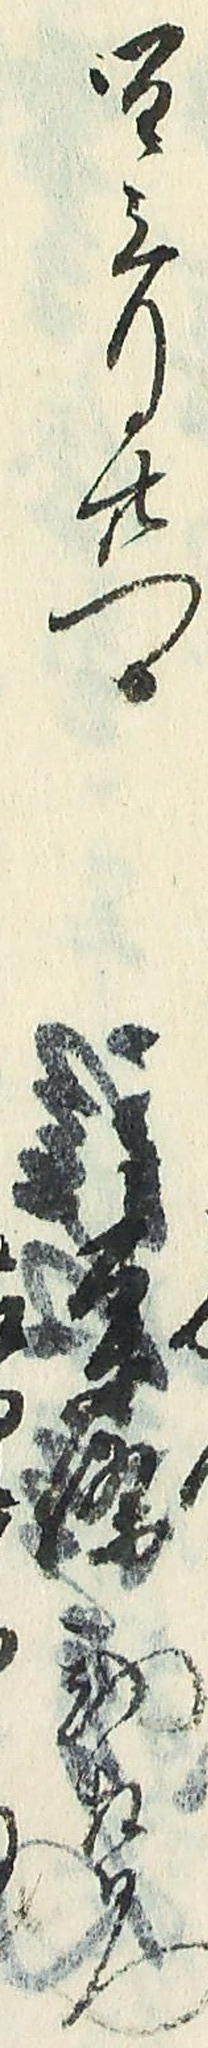閏三月廿一日福田篤三郎
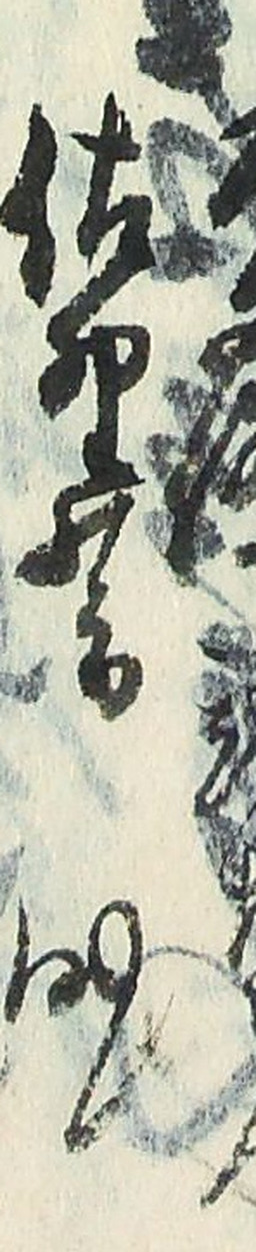佐野芳助
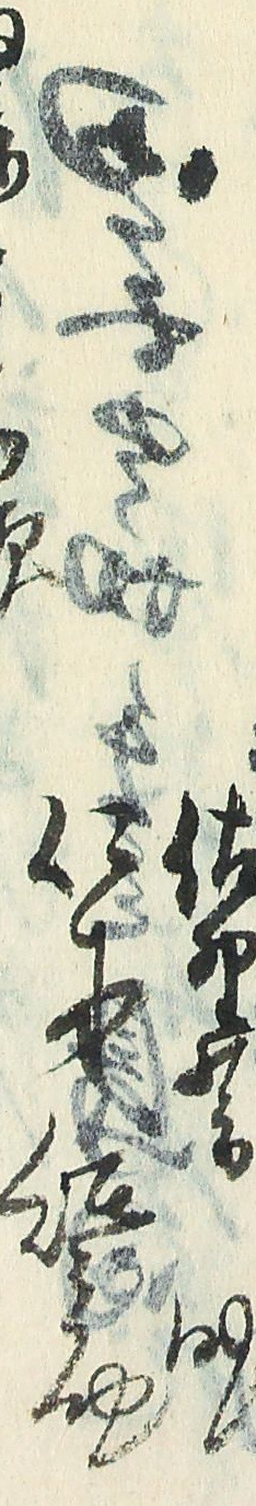仁木純之助
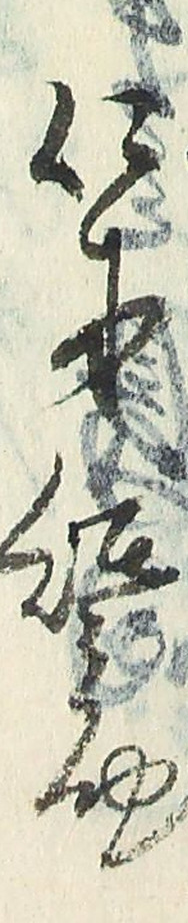仁木純之助
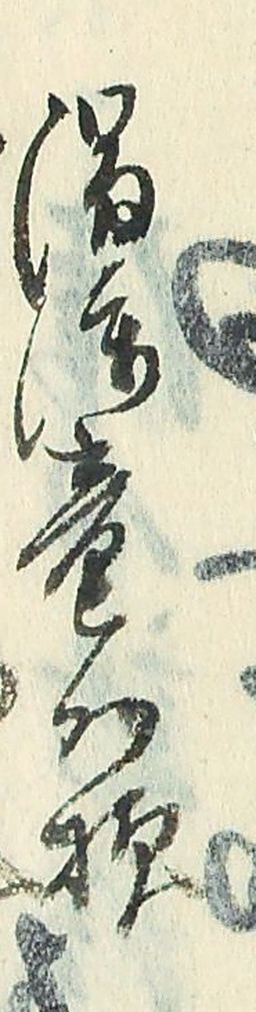湯浅竜助様
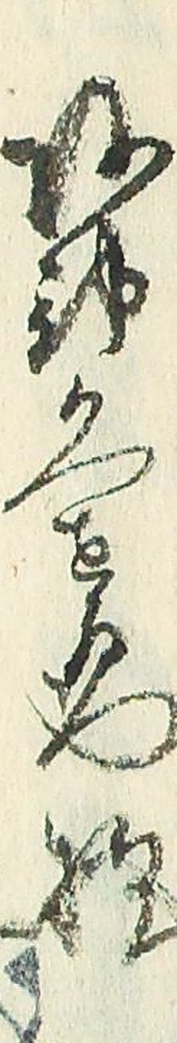阿部久左衛門様
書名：諸御趣意書并御下知向之写
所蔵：鳴門教育大学 Naruto University of Education
